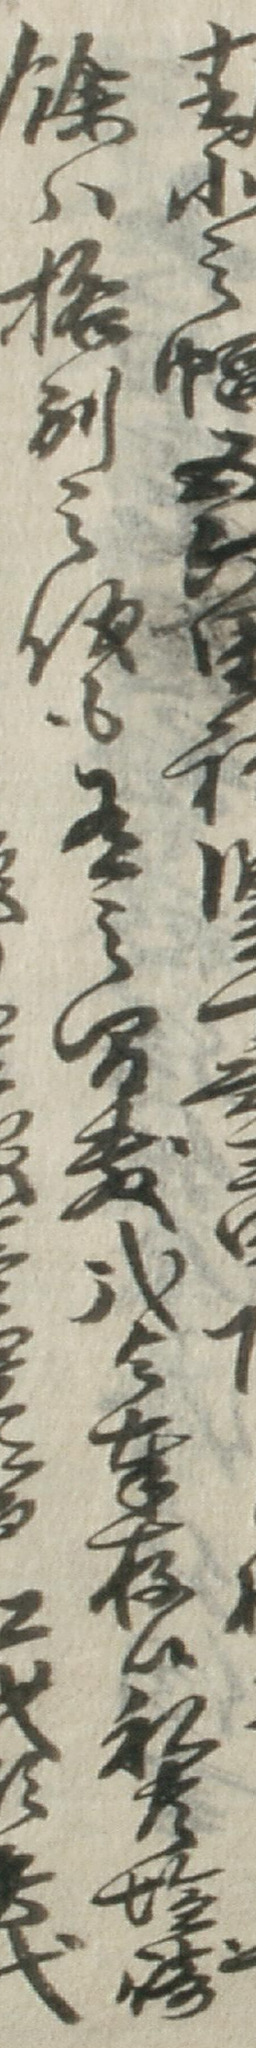餘ハ格別之儀も有之間敷と奉存候私共塩崎
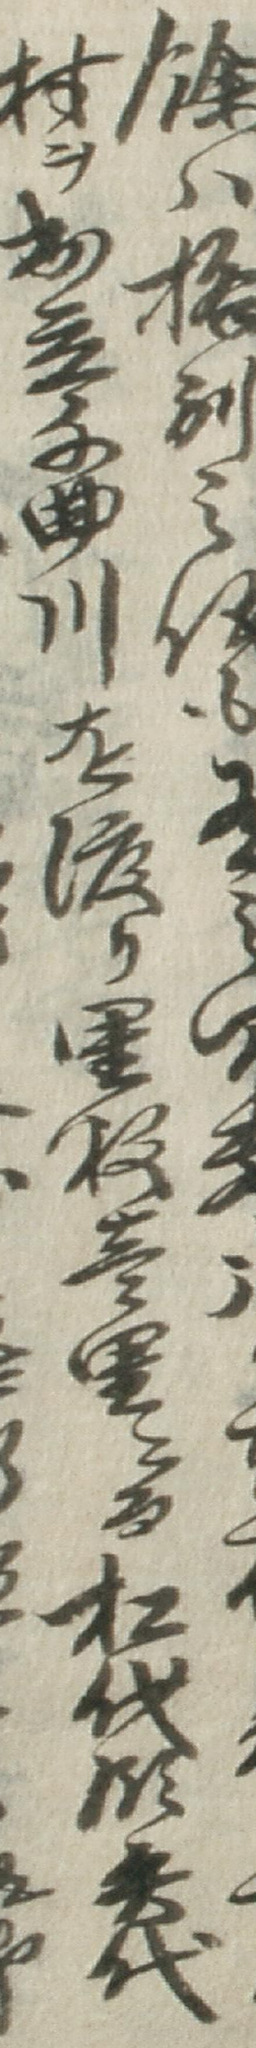村ヲ出立千曲川を渡り里数壱里二而松代領矢代
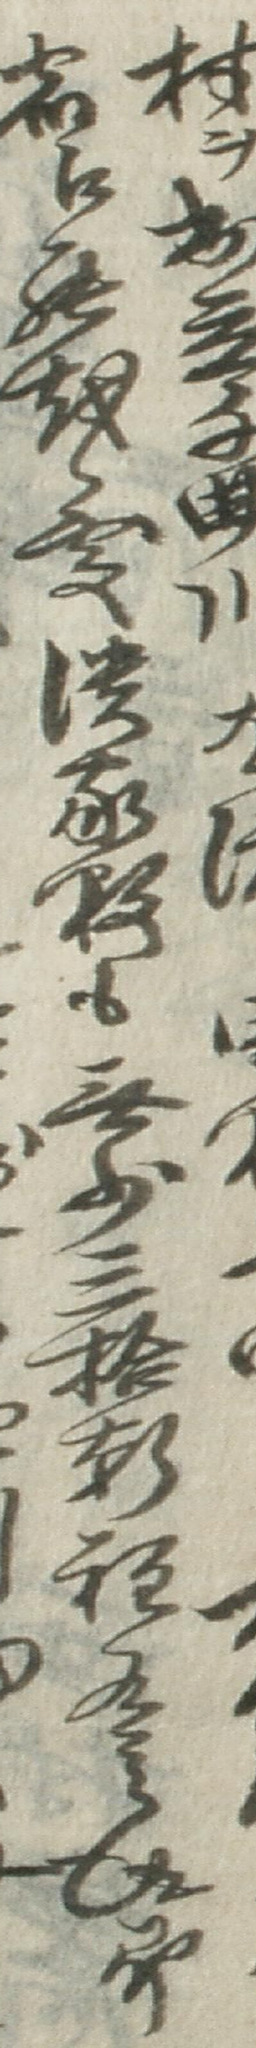宿江罷越候所潰家数も無少三拾軒程有之趣即
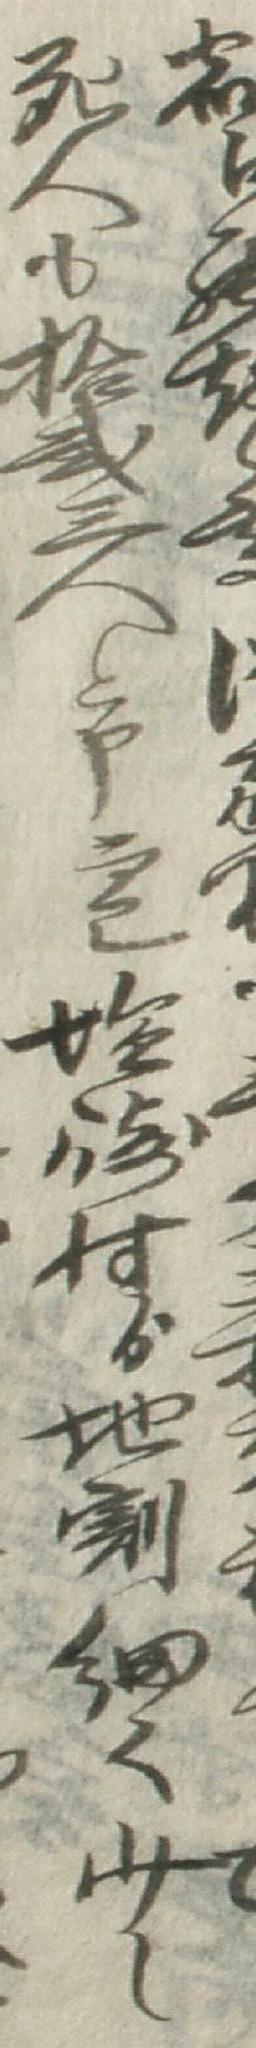死人も拾弐三人と申而巳塩崎村ゟ地割細く少ㇱ
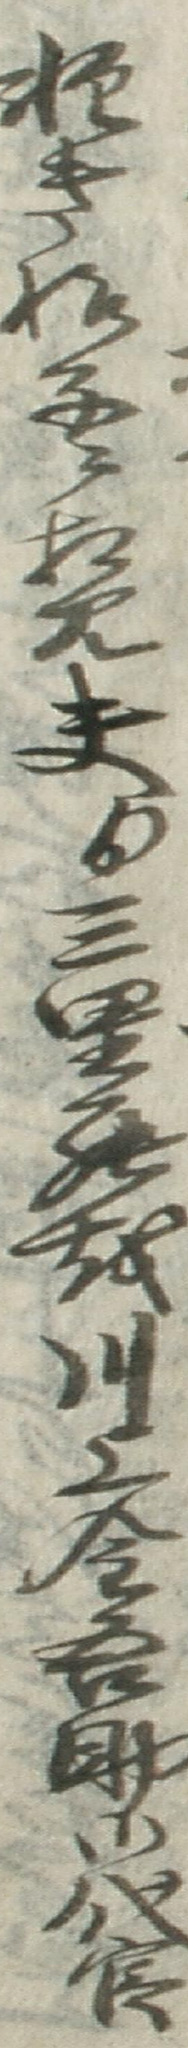軽き様子二相見夫ゟ三里罷越川上金吾助御代官
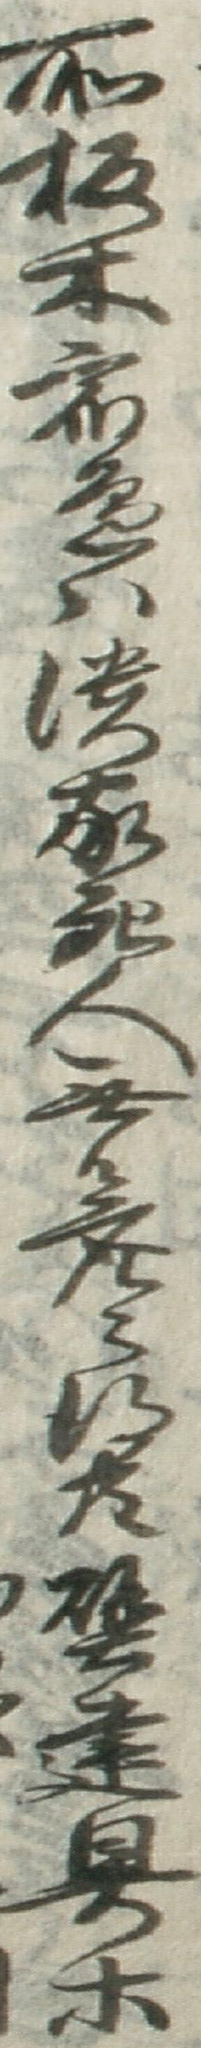所坂木宿辺ハ潰家死人無御座候得共壁建具等
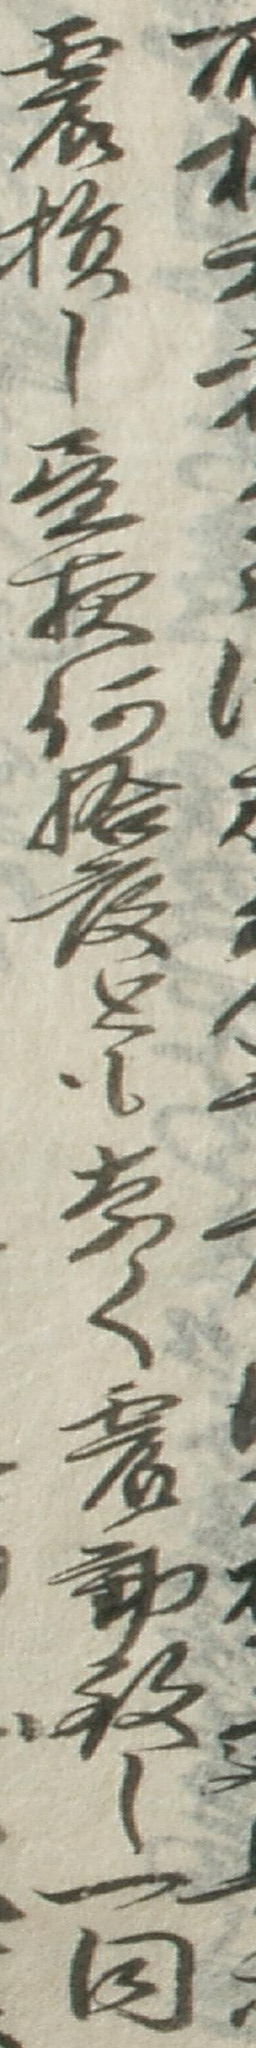損し昼夜何拾度ともなく震動致し一同
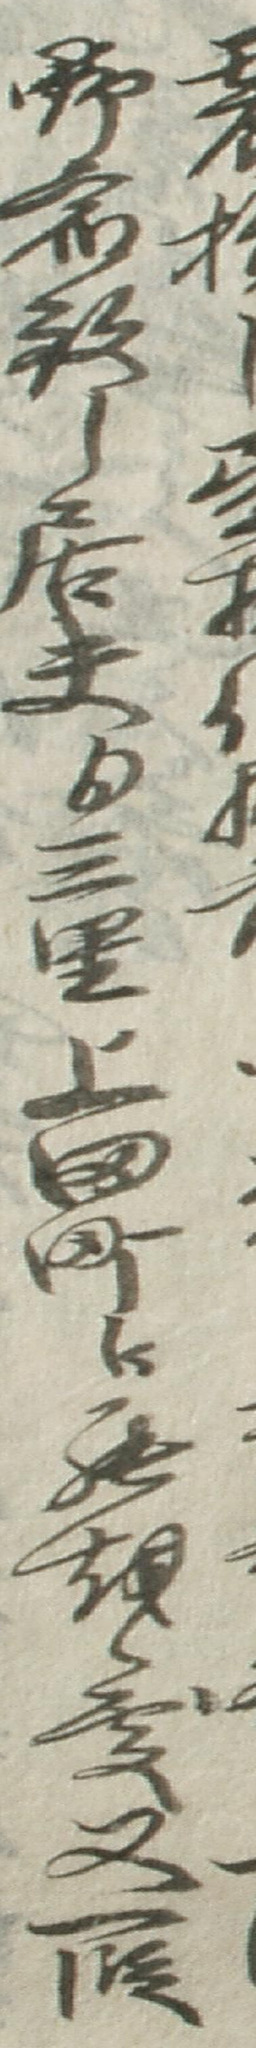野宿致し居夫ゟ三里上田町江罷越候所又一段
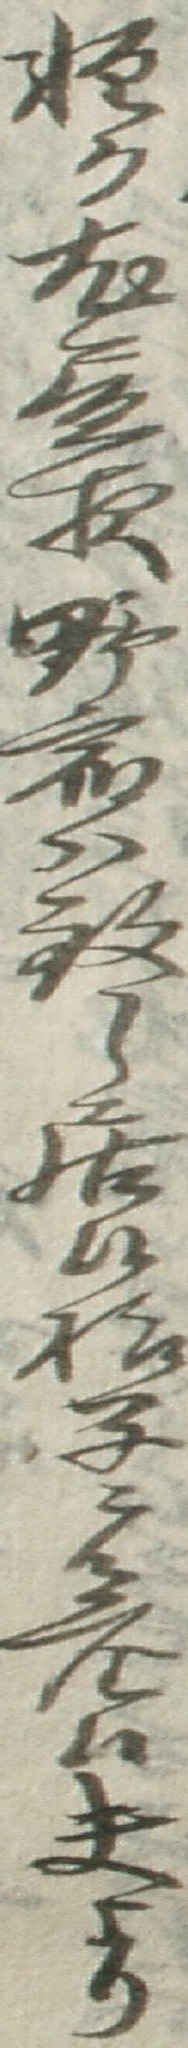軽く尤昼夜野宿ハ致し居候様子二御座候夫より
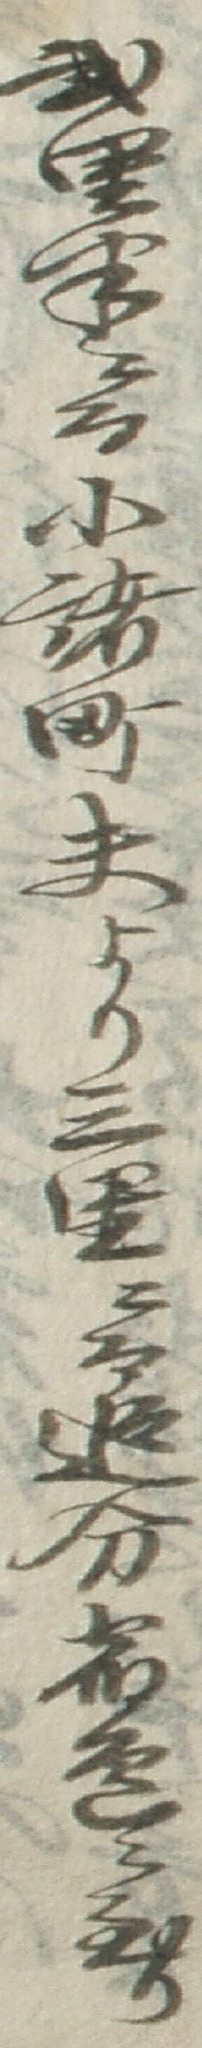弐里半二而小諸町夫ゟ三里二而追分宿辺二至り

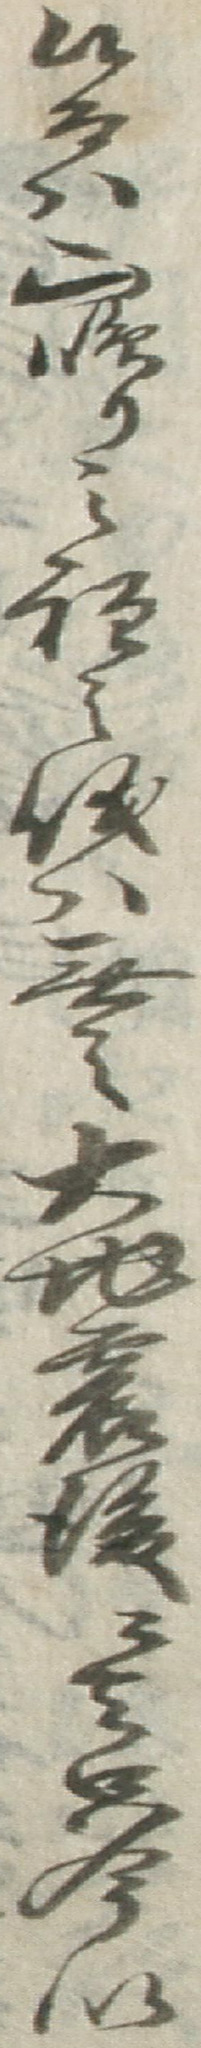候而ハ山鳴り之程之儀は無之大地震後二は只今以
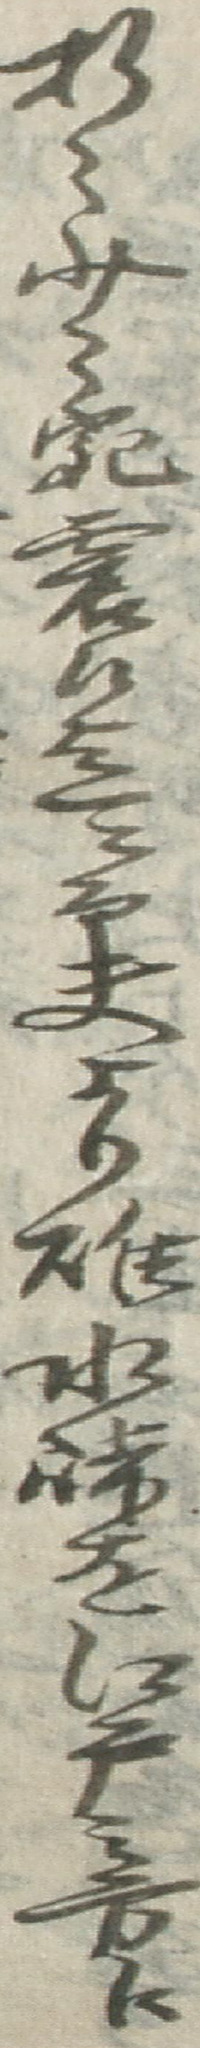折々少々宛震候迄二而夫より碓氷峠を江戸之方江
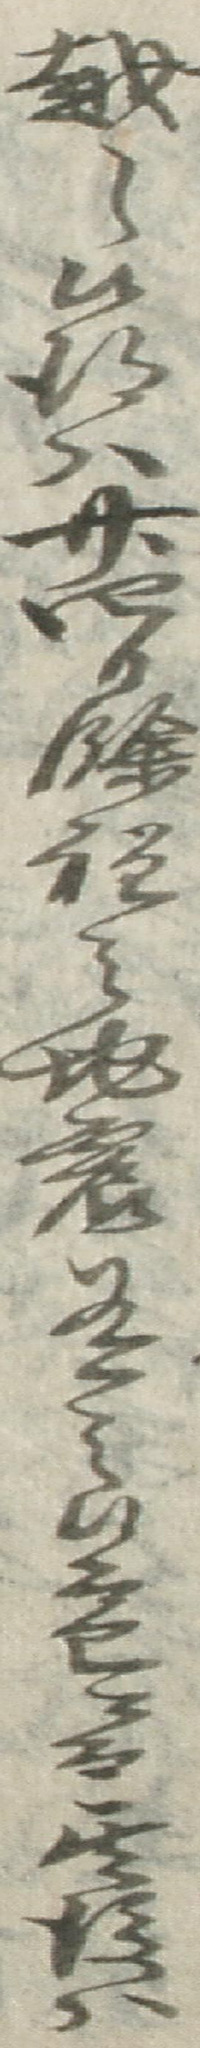越し候得ハ廿四日餘程之地震有之候而巳二而其後ハ
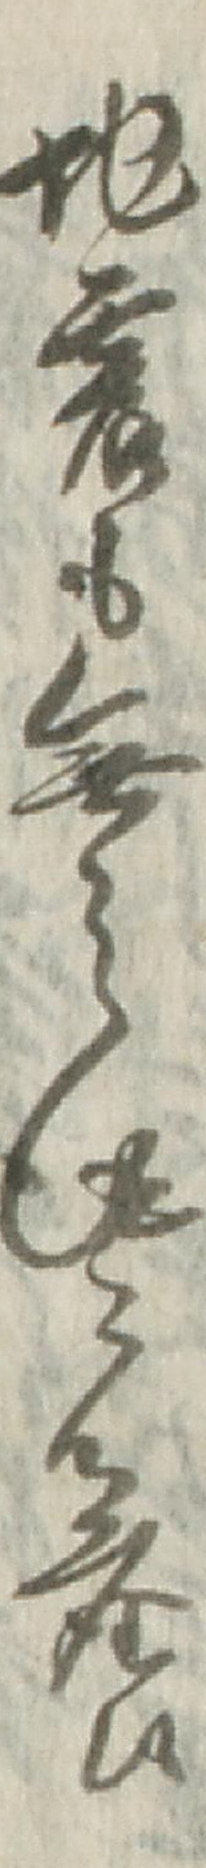地震も無之趣二御座候
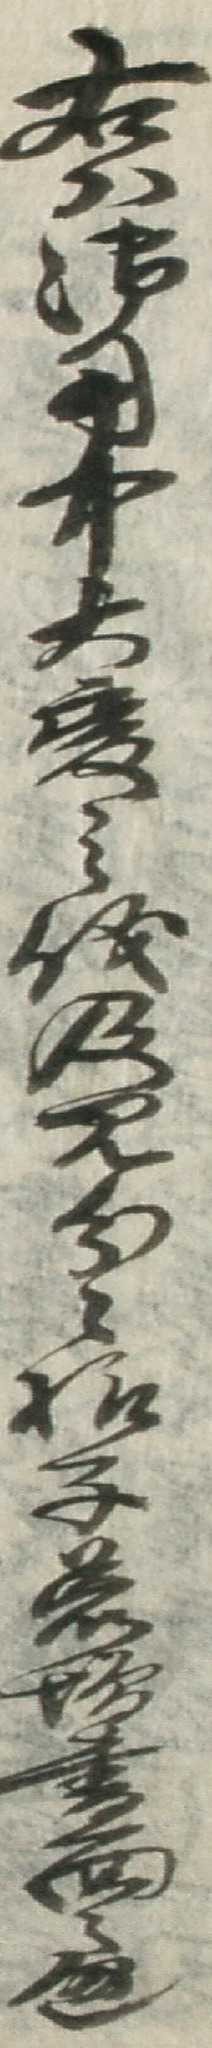右ハ御用中大変之儀及見分候様子荒増書面之通
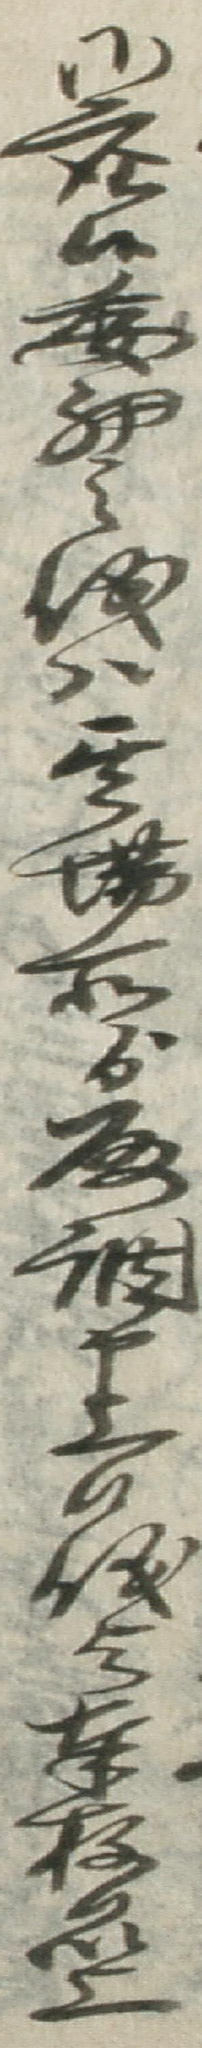御座候委細之儀ハ其場所ゟ取調申上候儀と奉存候以上
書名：信濃國地震實録記
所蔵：東京大学地震研究所図書室 Earthquake Research Institute Library, The University of Tokyo, JAPAN
